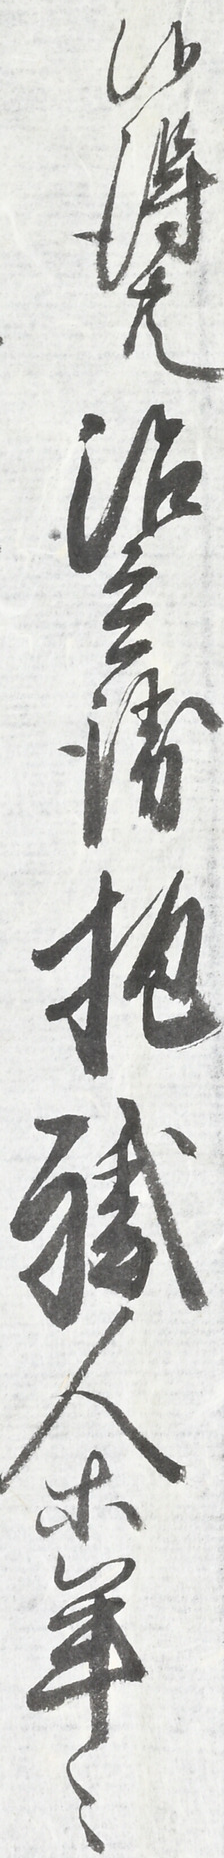候得共治兵衛抱職人等年々

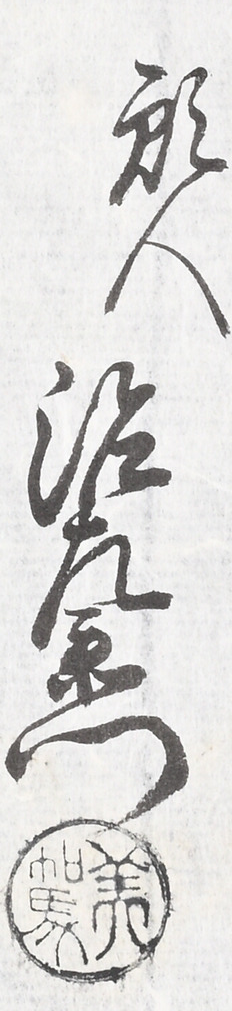願人治左衛門㊞
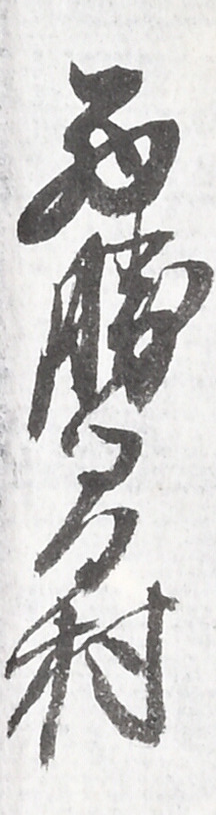西勝間村
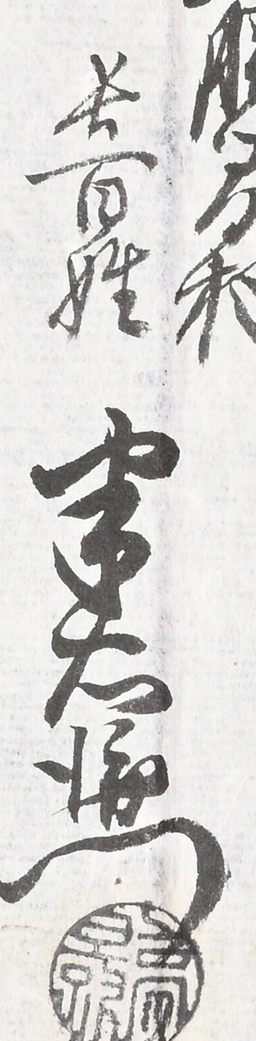長百姓半右衛門㊞
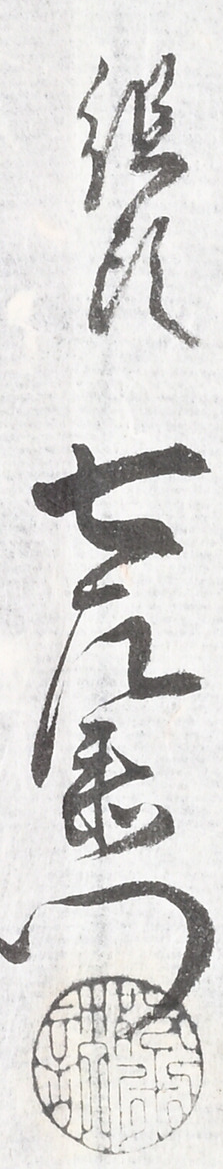組頭七左衛門㊞
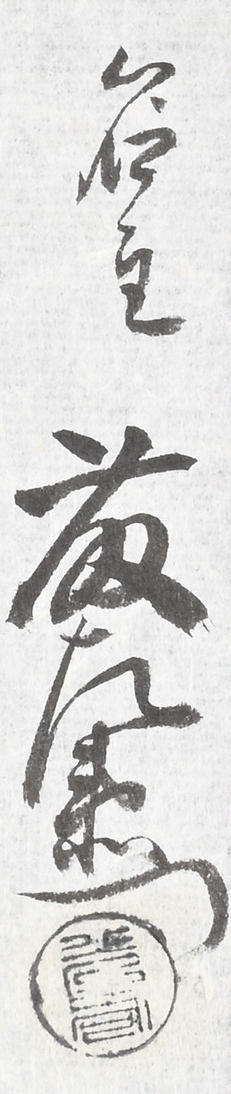名主藤左衛門㊞
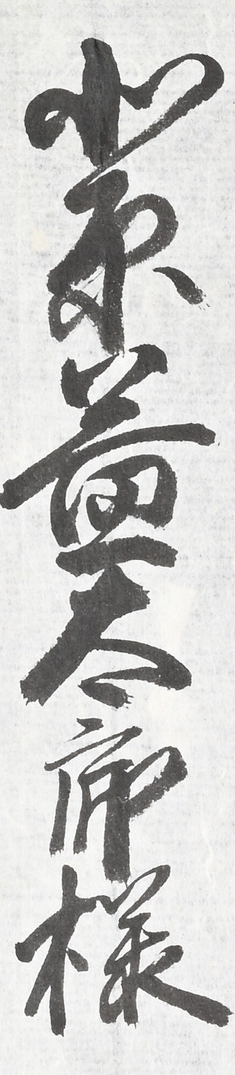北原益太郎様
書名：乍恐以書付奉願上候
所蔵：伊那市立高遠町図書館・合同会社AMANE
